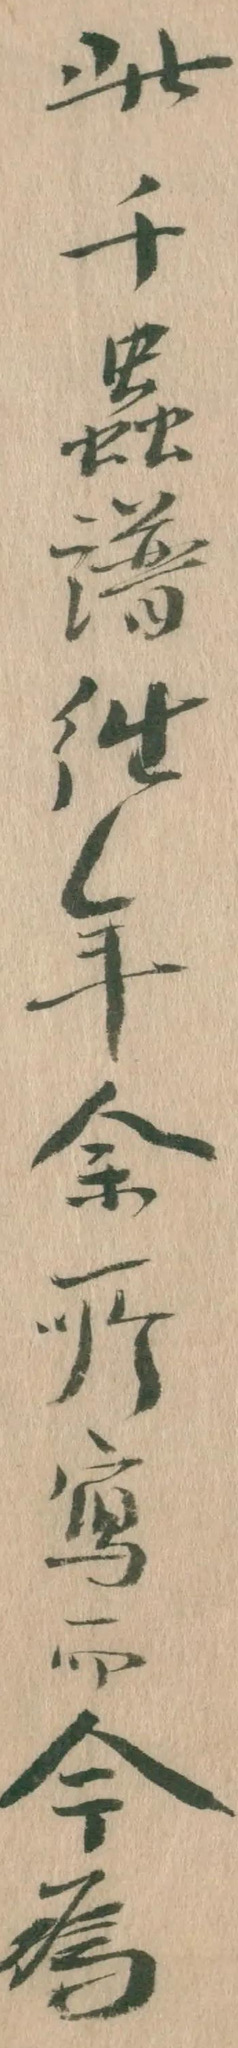此千蟲譜往年余所冩而今爲
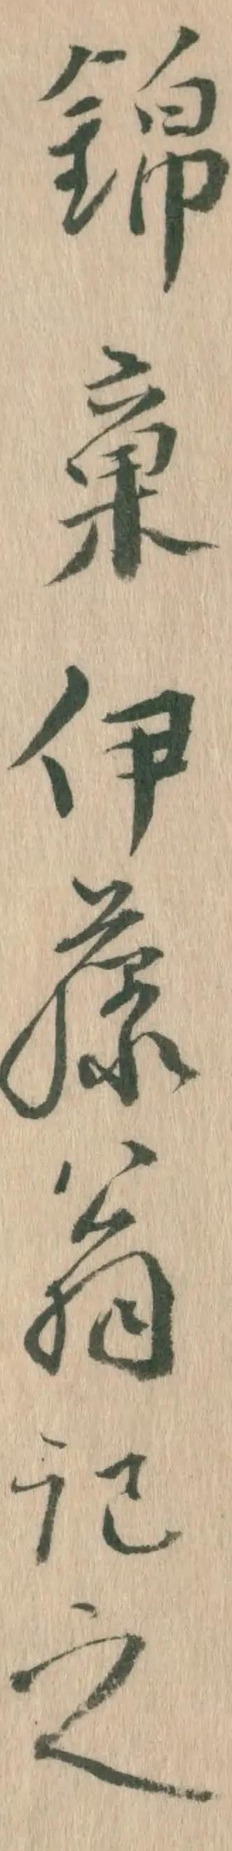錦窠伊藤翁記之
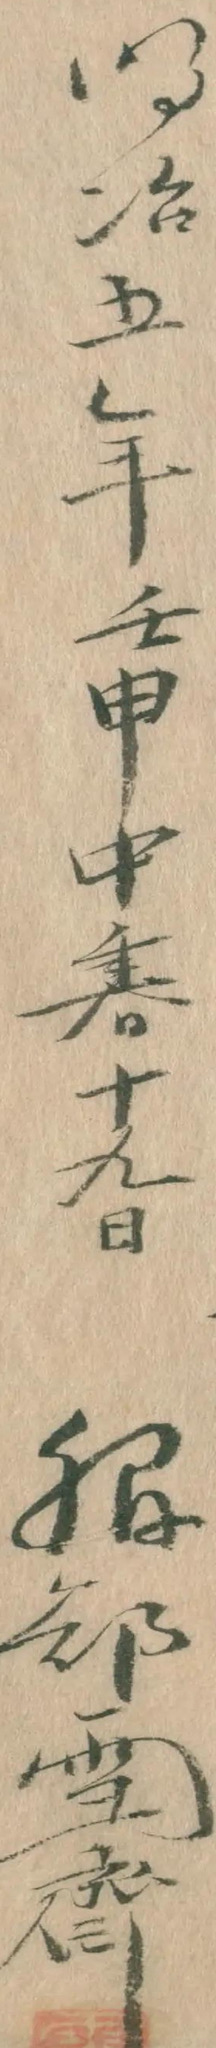明治五年壬申中春十九日六十六歳
